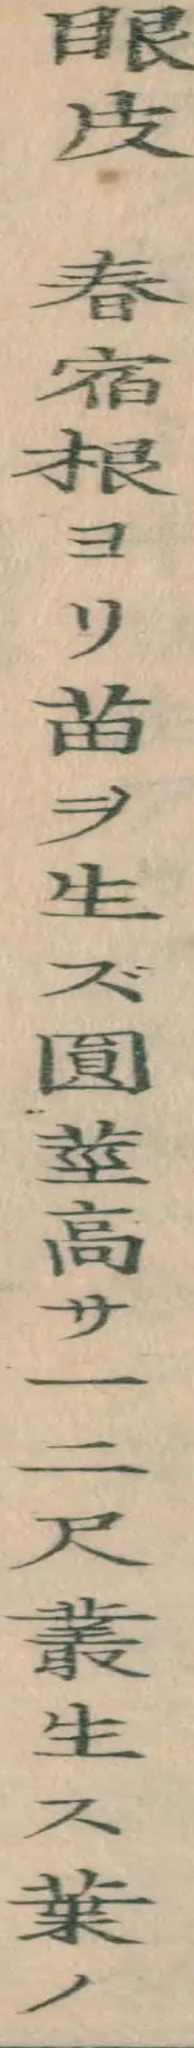眼皮春宿根ヨリ苗ヲ生ズ円茎高サ一二尺叢生ス葉ノ
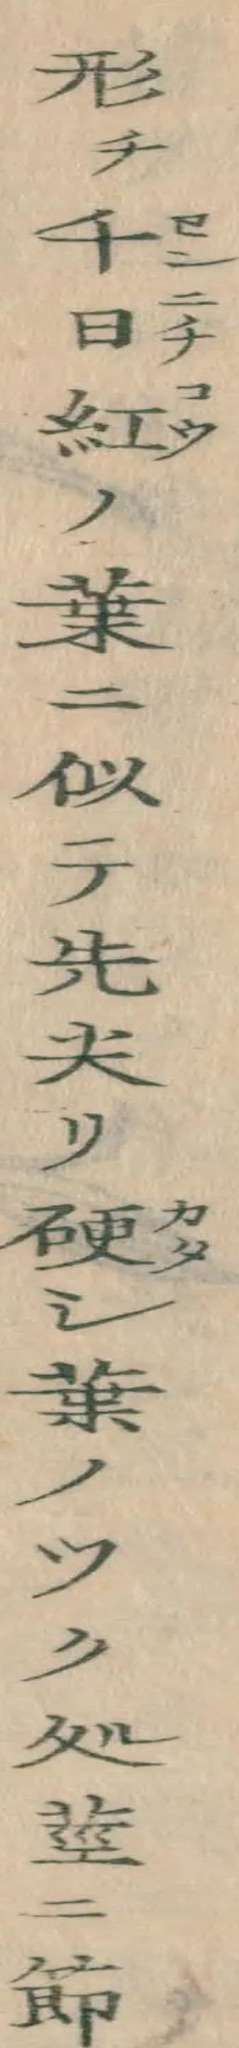形千日紅ノ葉ニ似テ先尖リ硬シ葉ノツク処茎ニ節
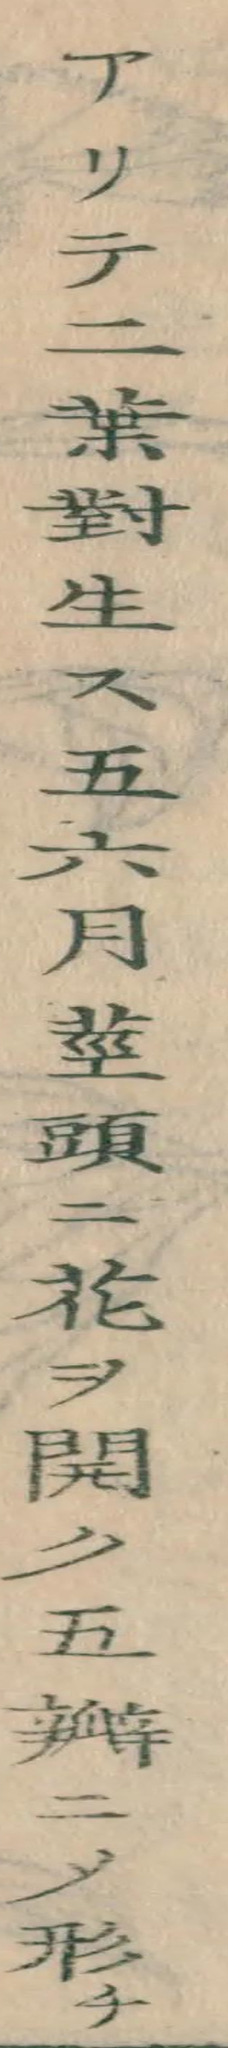アリテ二葉対生ス五六月茎頭ニ花ヲ開ク五弁ニシテ形
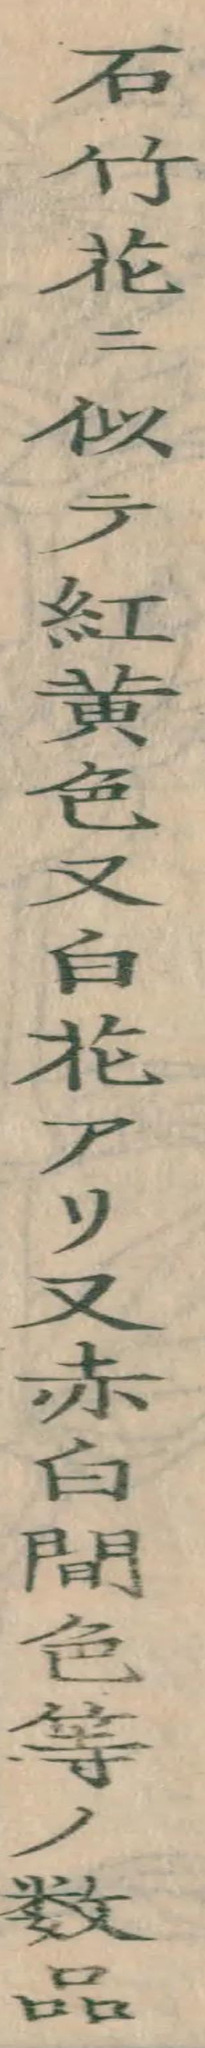石竹花ニ似テ紅黄色又白花アリ又赤白間色等ノ数品
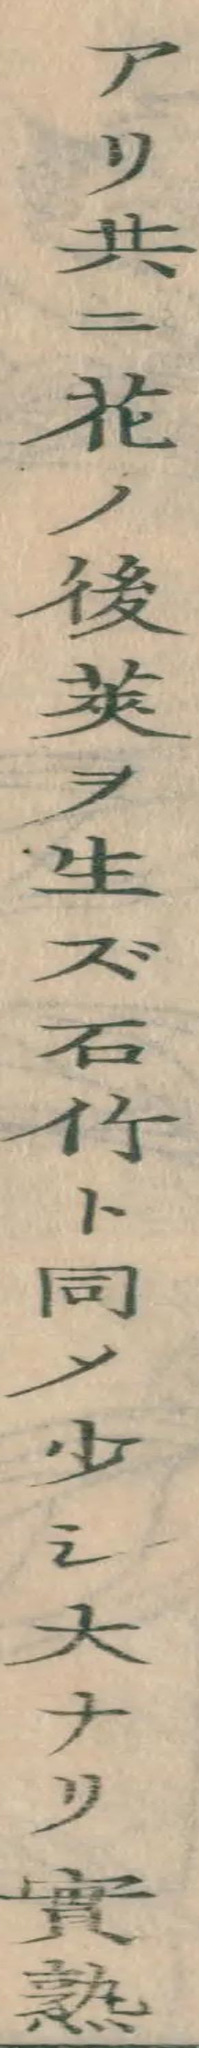アリ共ニ花ノ後莢ヲ生ズ石竹ト同シテ少シ大ナリ実熟
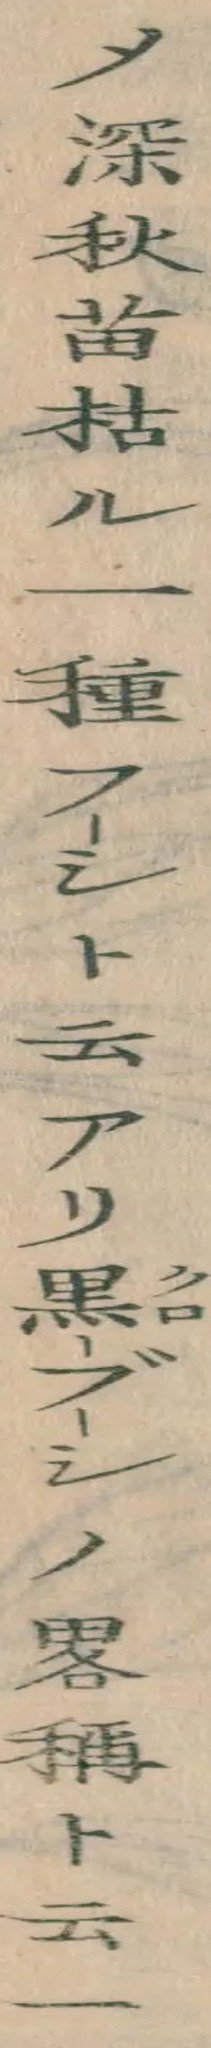シテ深秋苗枯ル一種フ-シト云アリ黒-ブ-シノ略称ト云一
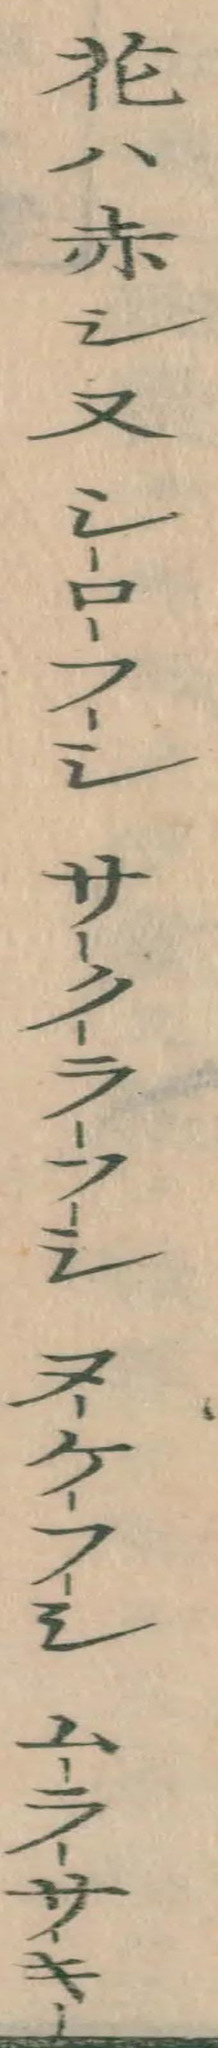花ハ赤シ又シ-ロ-フ-シサ-ク-ラ-フ-シヌ-ケ-フ-シム-ラ-サ-キ-
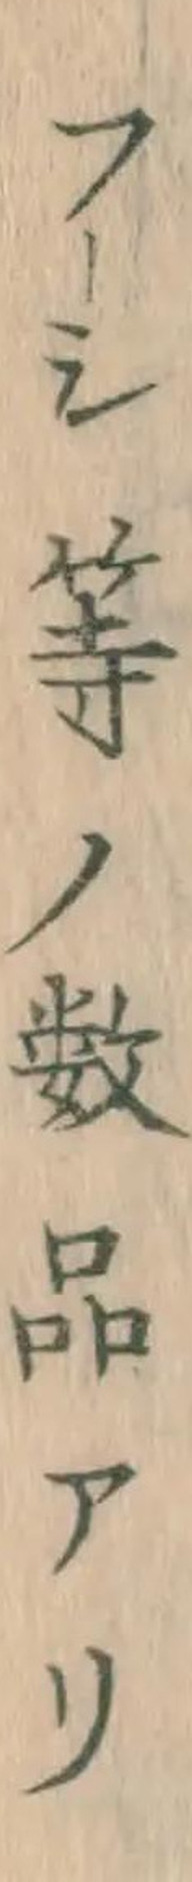フ-シ等ノ数品アリ
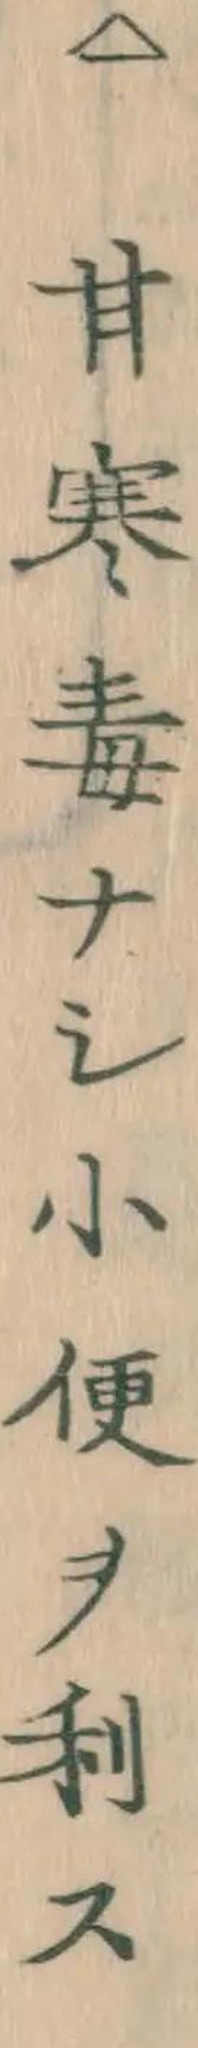△甘寒毒ナシ小便ヲ利ス

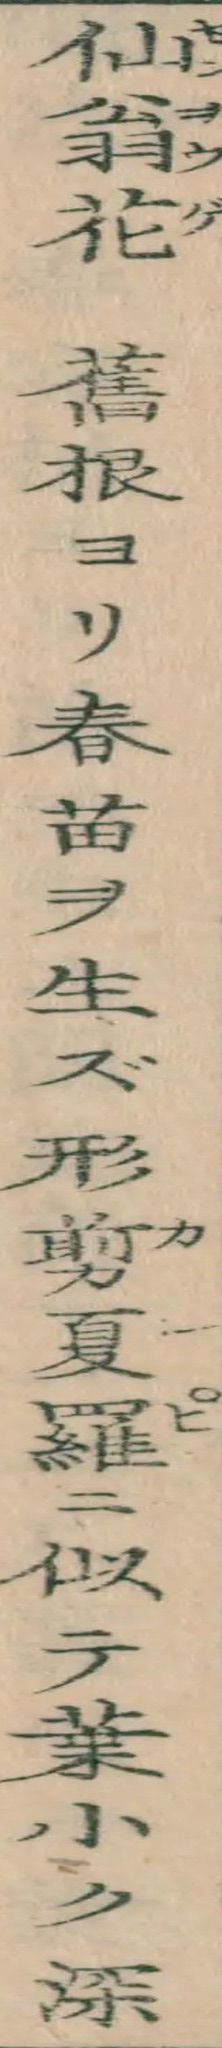仙翁花旧根ヨリ春苗ヲ生ズ形剪夏羅ニ似テ葉小ク深
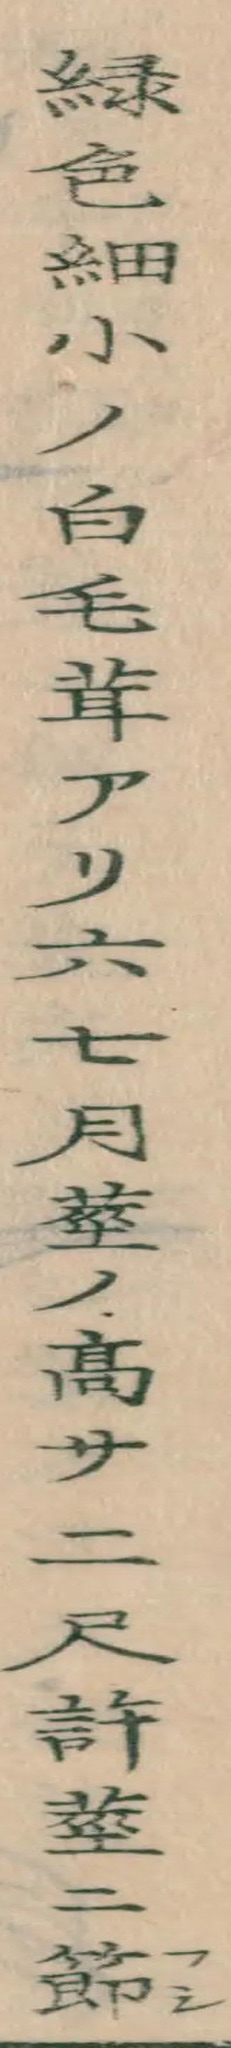緑色細小ノ白毛茸アリ六七月茎ノ高サ二尺許茎ニ節
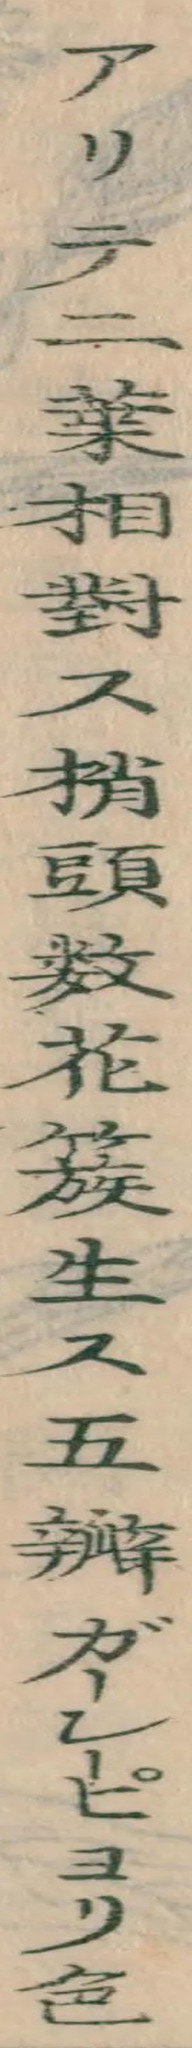アリテ二葉相対ス梢頭数花簇生ス五弁ガ-ン-ピヨリ色
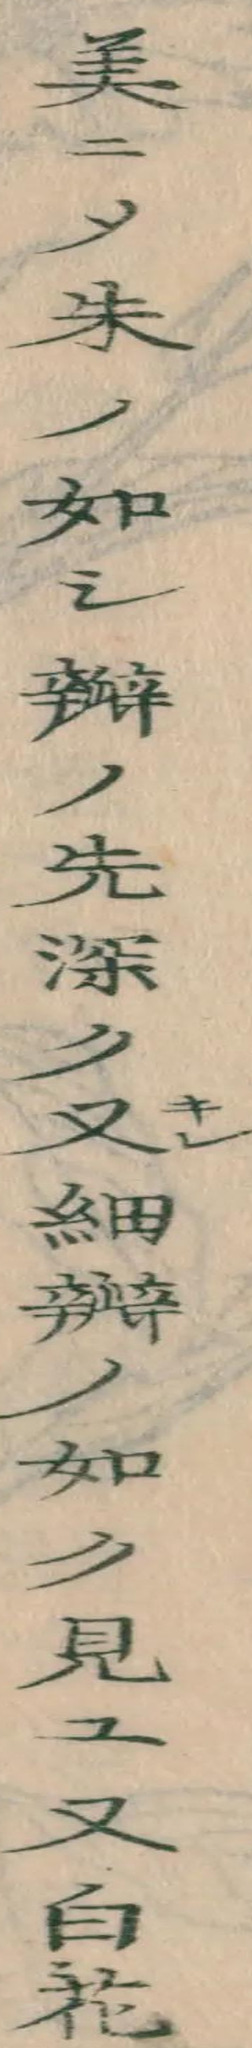美ニシテ朱ノ如シ弁ノ先深ク叉細弁ノ如ク見ユ又白花
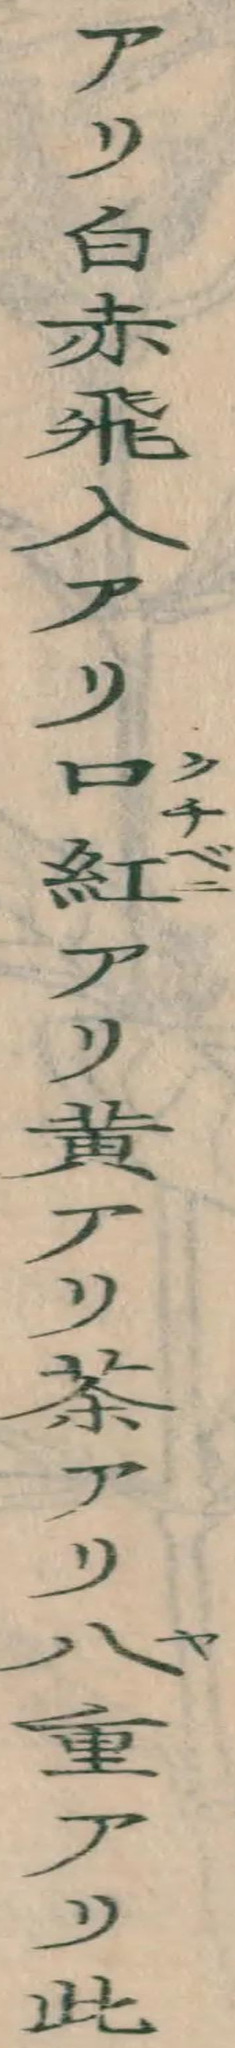アリ白赤飛入アリ口紅アリ黄アリ茶アリ八重アリ此
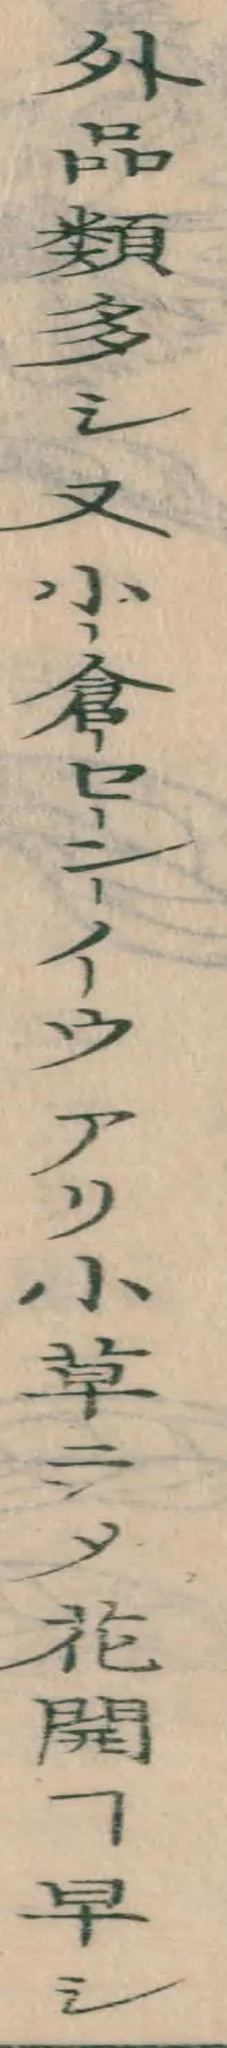外品類多シ又小-倉-セ-ン-ノ-ウアリ小草ニシテ花開コト早シ
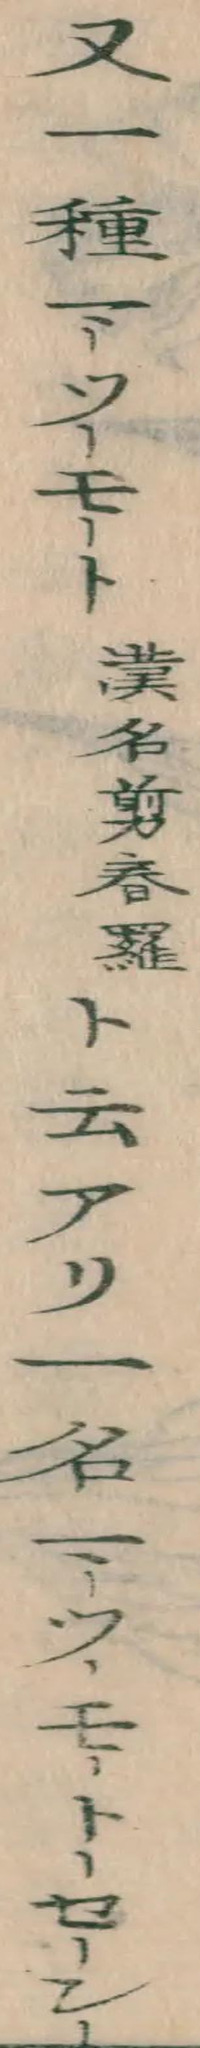又一種マ-ツ-モ-ト漢名剪春羅ト云アリ一名マ-ツ-モ-ト-セ-ン-
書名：これこれ草 2巻. [2]
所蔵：国立国会図書館 National Diet Library, JAPAN
